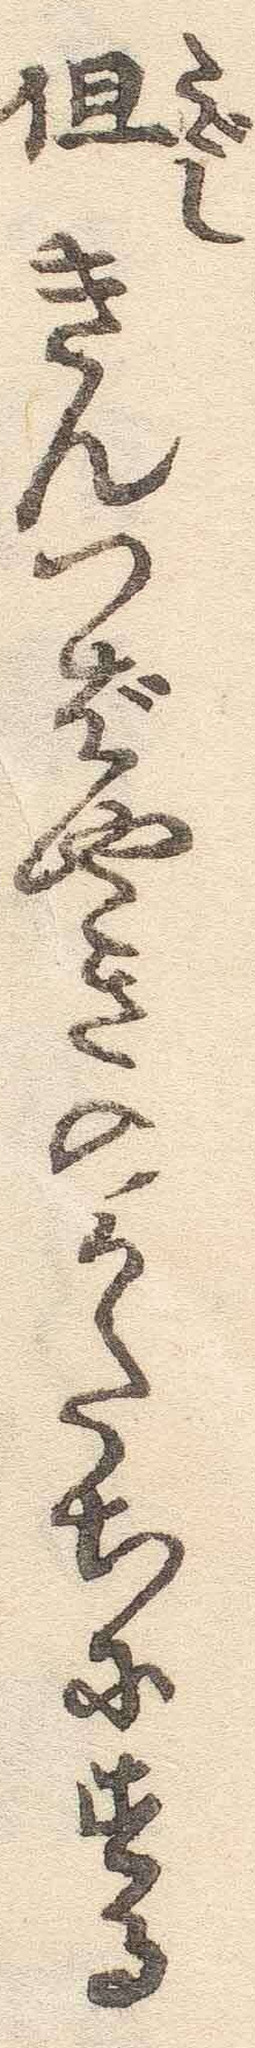但きんつばやきのかたちにする
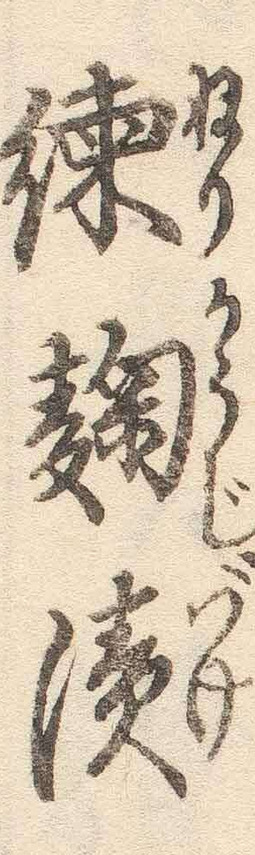練麹漬
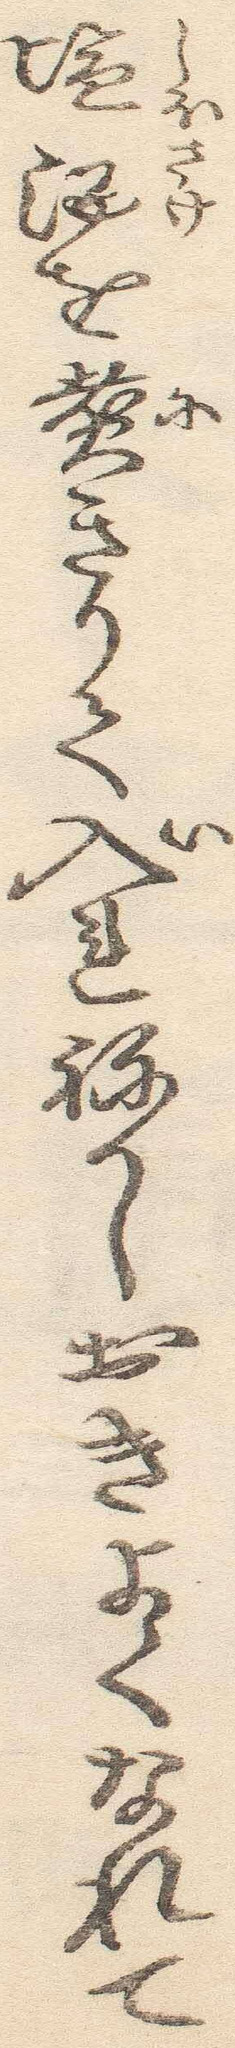塩酒を煮きりて入れねかしおきよくなれて
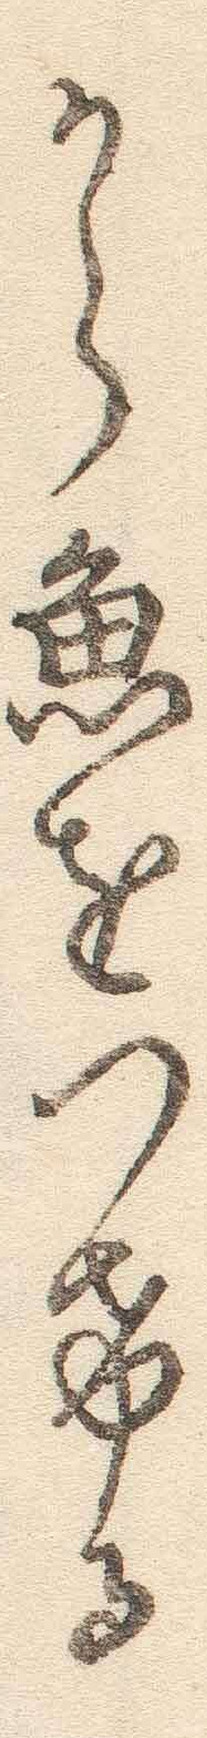から魚をつける
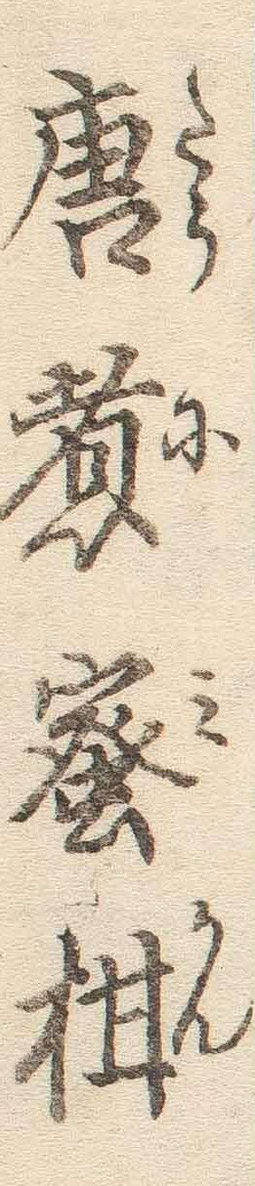唐煮蜜柑
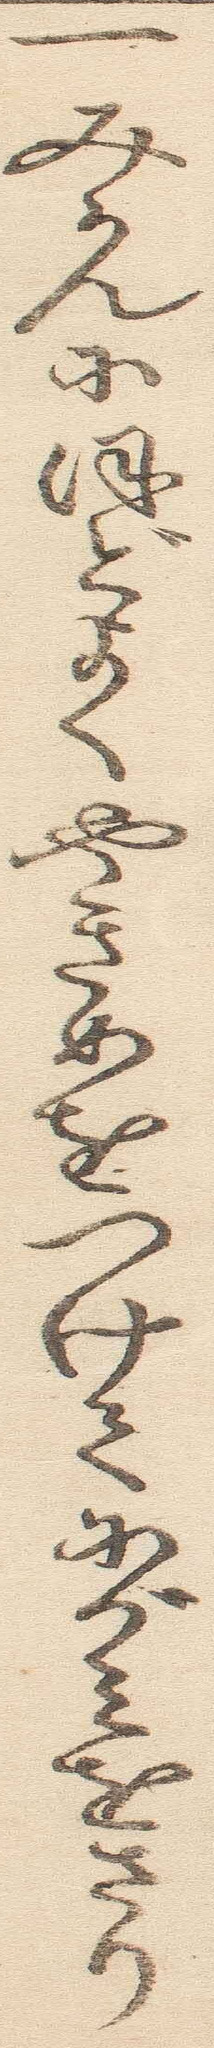一みかんにほどよくやきめをつけてにがみをさり
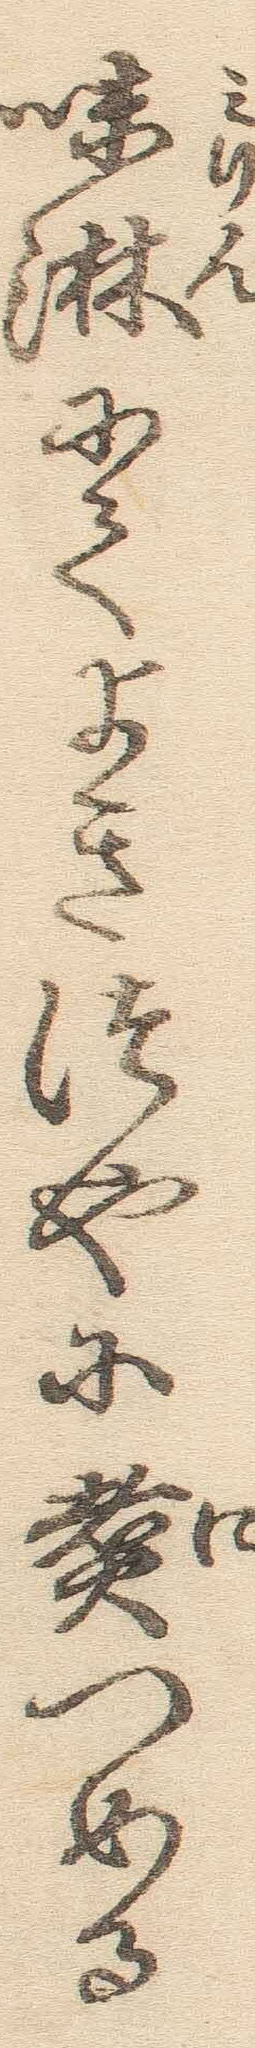味淋にてよきつやに煮つめる

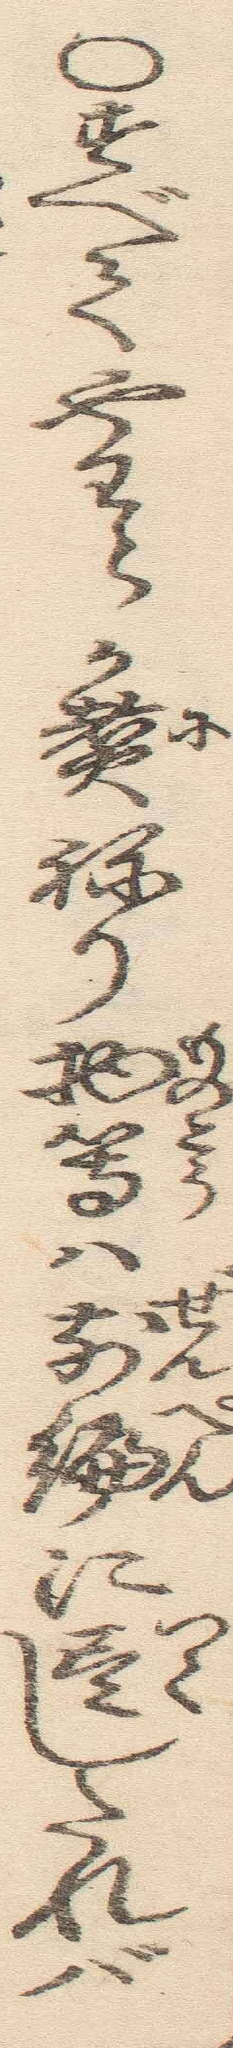○すべてやわらか煮ねり物等は前編に尽したれば
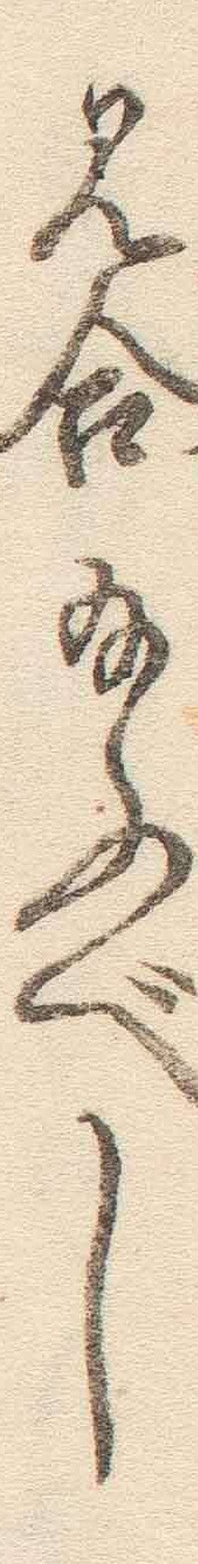見合給ふべし
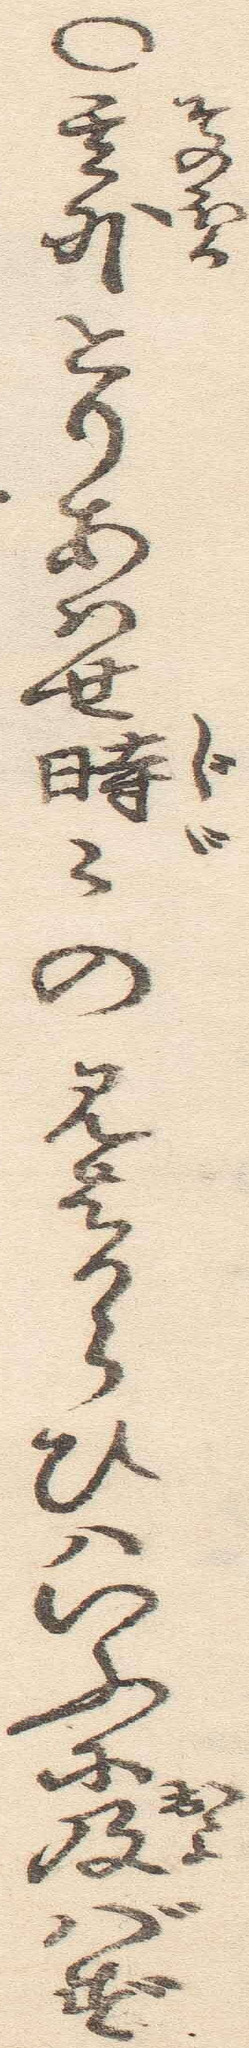○其外とりあはせ時々の見はからひはいふに及ばず
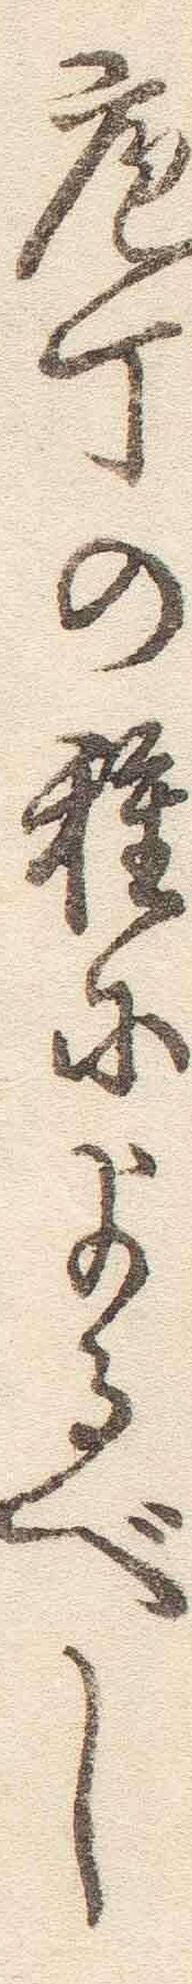庖丁の種によるべし
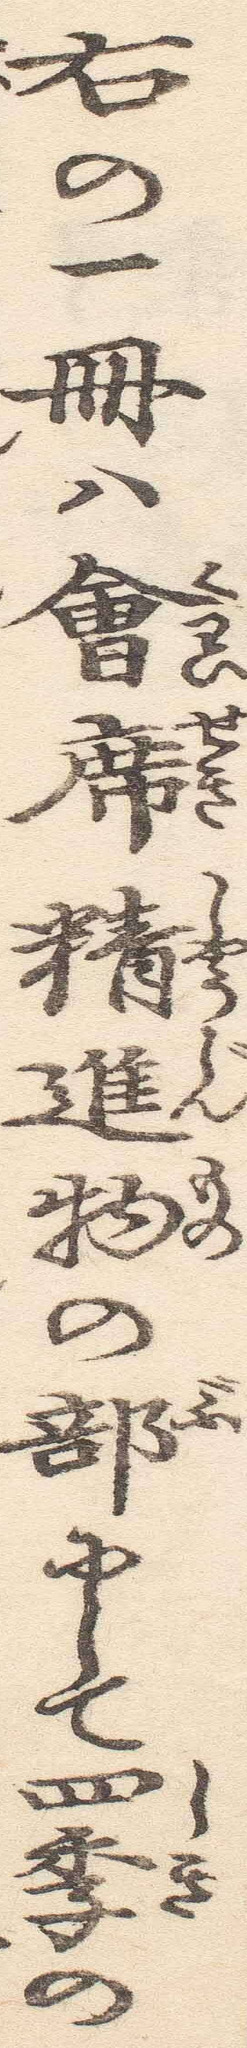右の一冊は会席精進物の部にして四季の
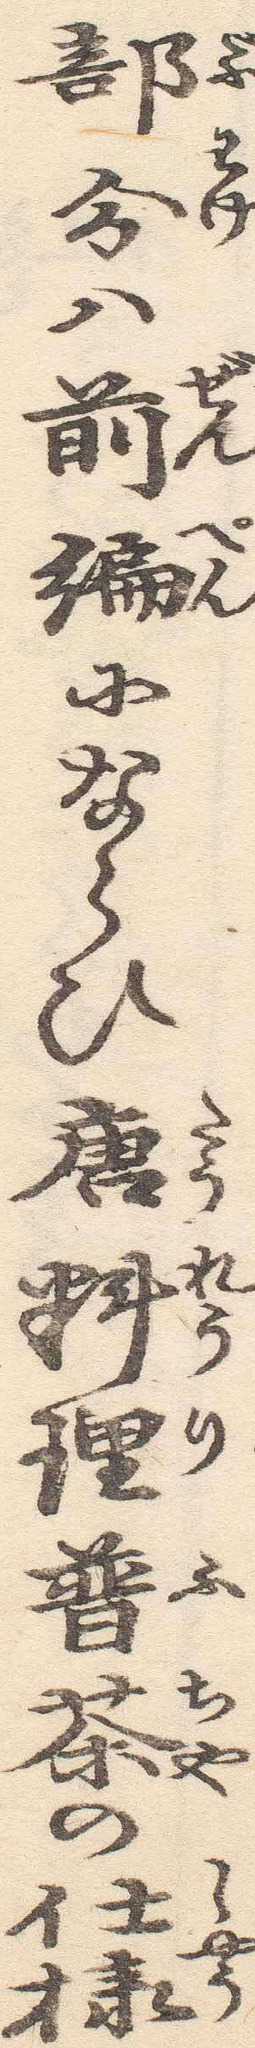部分は前編にならひ唐料理普茶の仕様
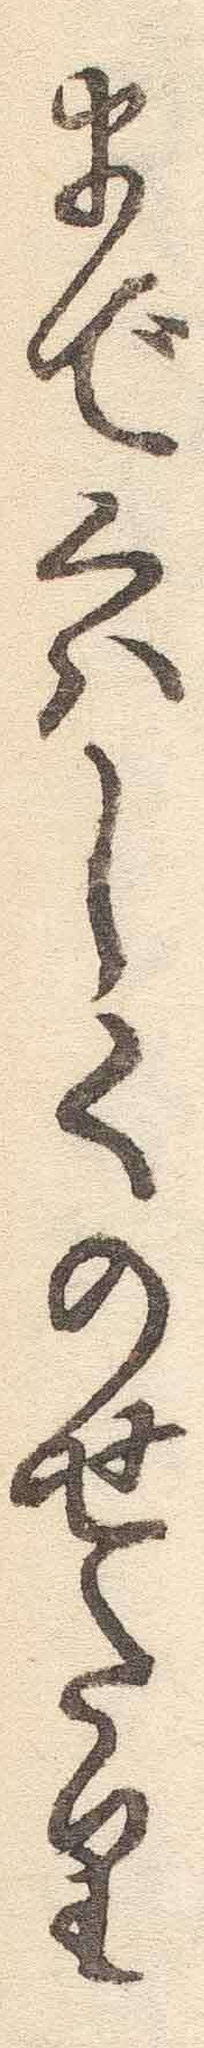までくはしくのせたり

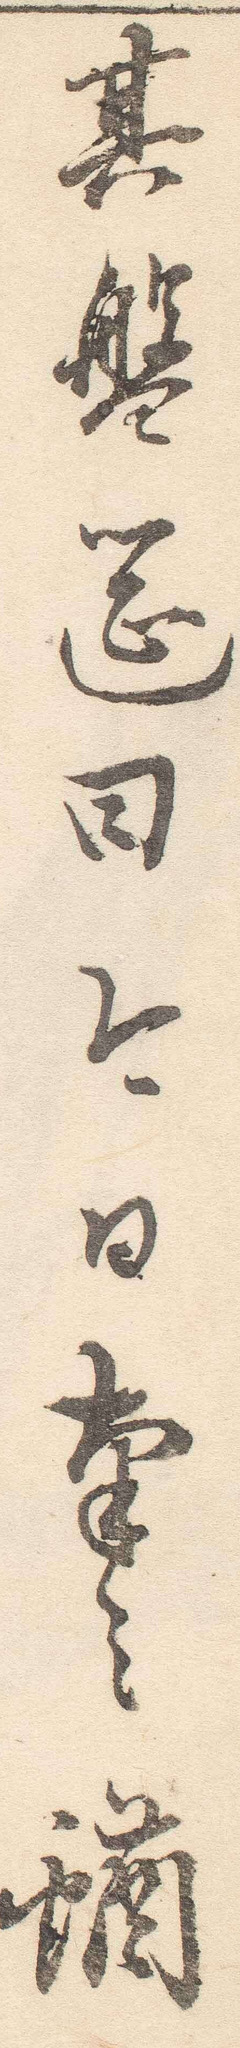其盤筵曰今日南之鰌
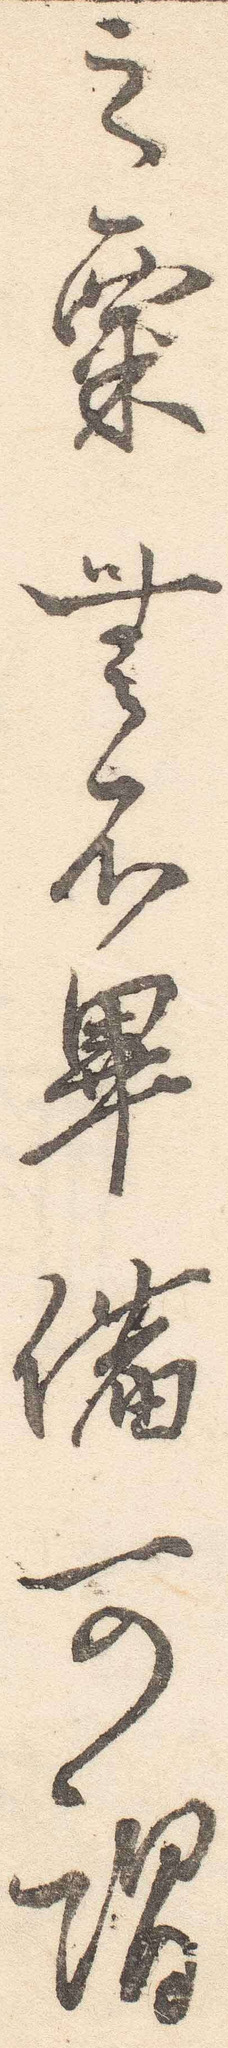之粟無不畢備可謂
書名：料理通
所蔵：東京学芸大学附属図書館 国文学研究資料館
